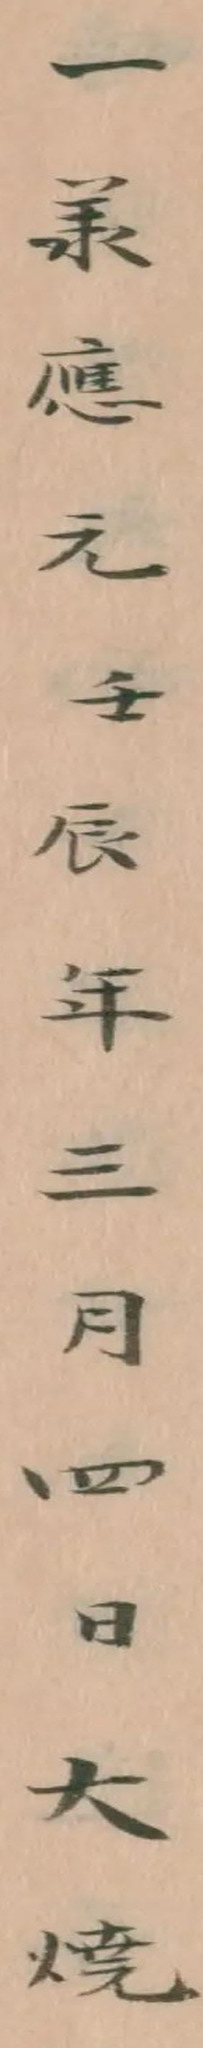一承応元壬辰年三月四日大焼
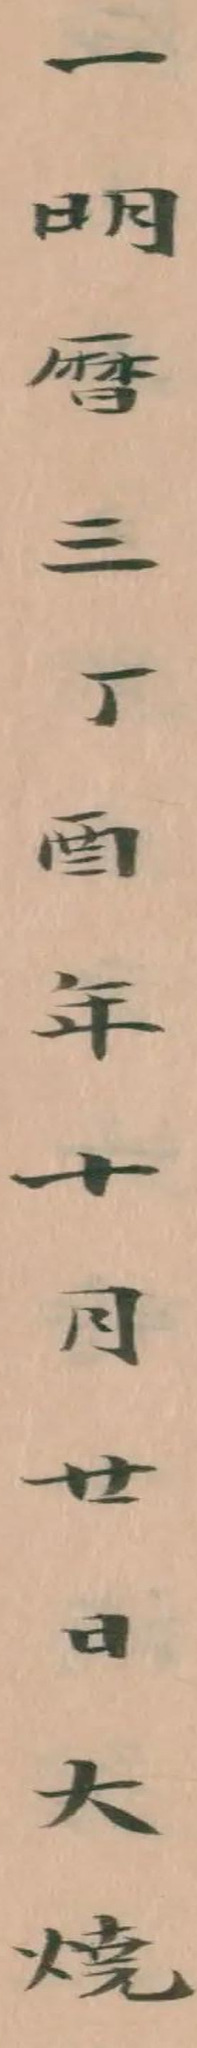一明暦三丁酉年十月廿日大焼
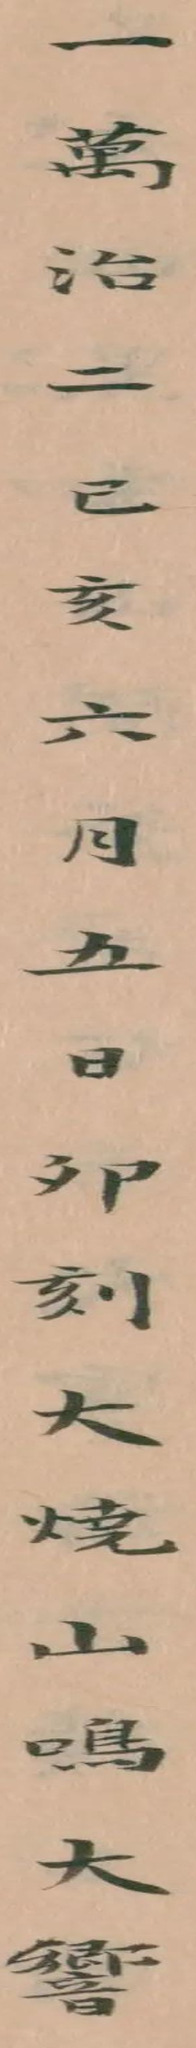一万治二己亥六月五日卯刻大焼山鳴大響
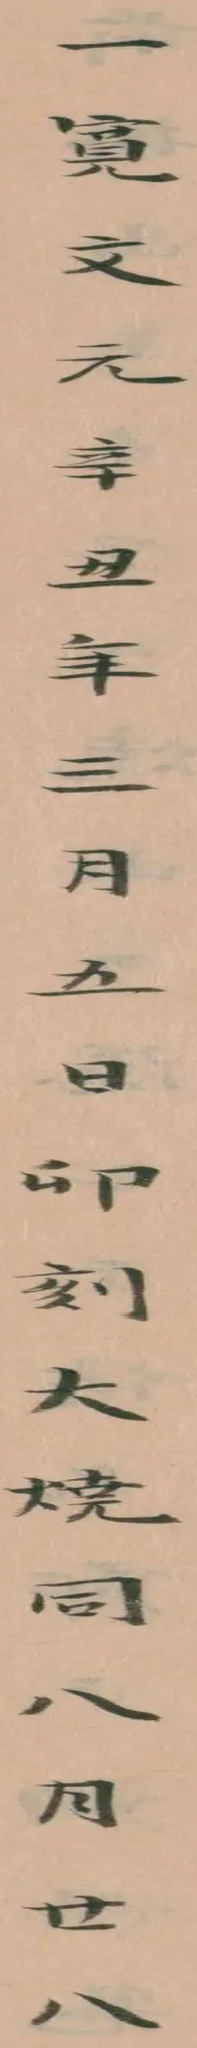一寛文元辛丑年三月五日卯刻大焼同八月廿八
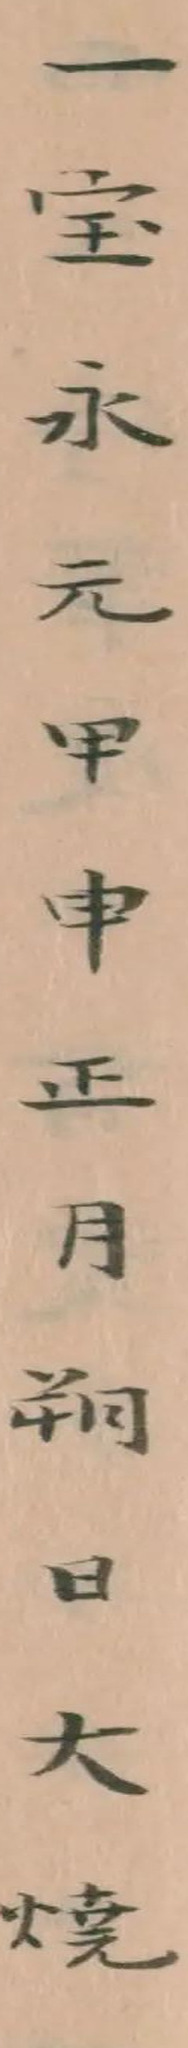一宝永元甲申正月朔日大焼
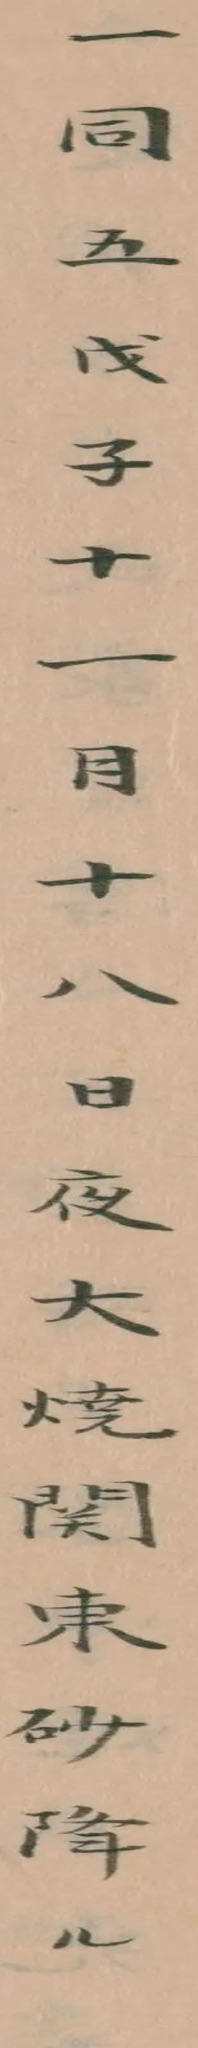一同五戌子十一月十八日夜大焼関東砂降ㇽ
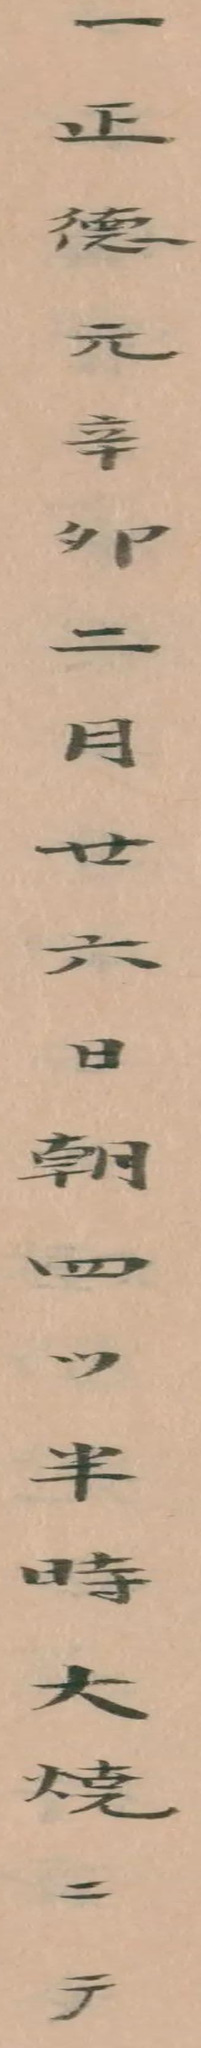一正徳元辛卯二月廿六日朝四ッ半時大焼ニテ
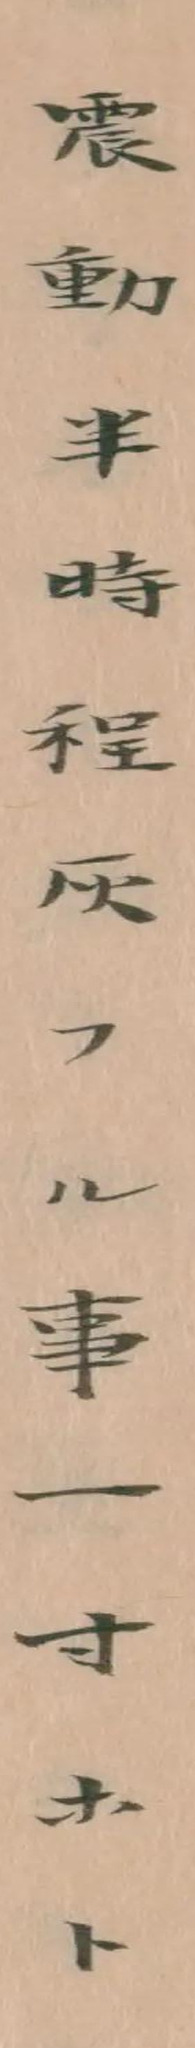震動半時程灰フル事一寸ホト
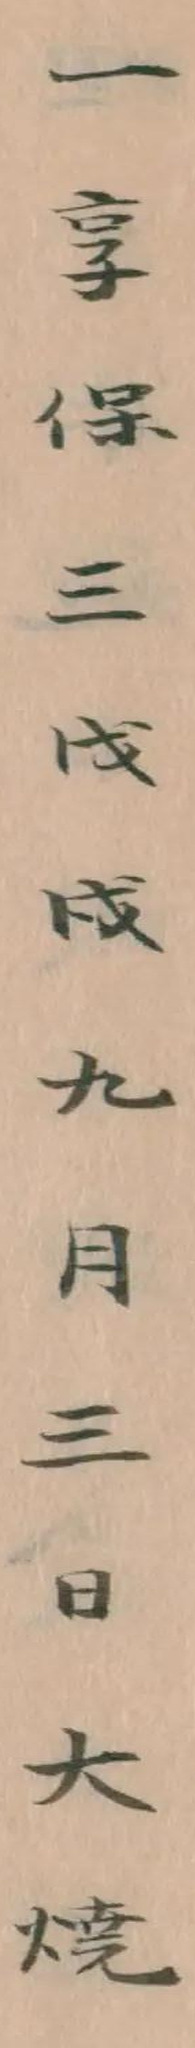一享保三戊戌九月三日大焼
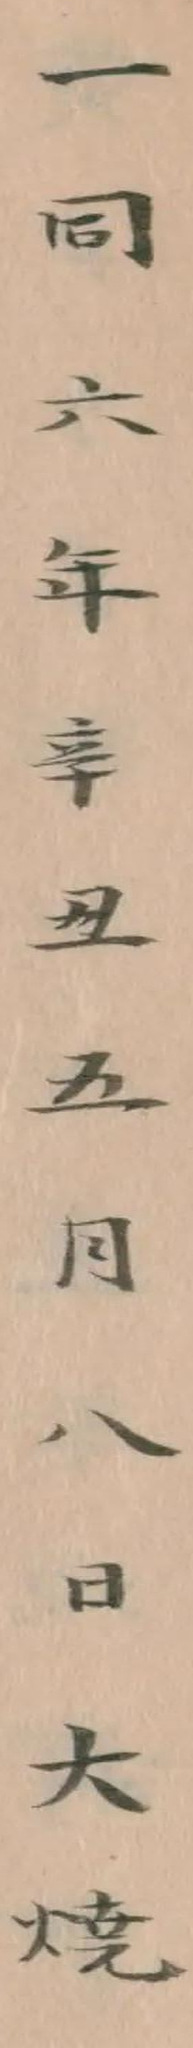一同六年辛丑五月八日大焼
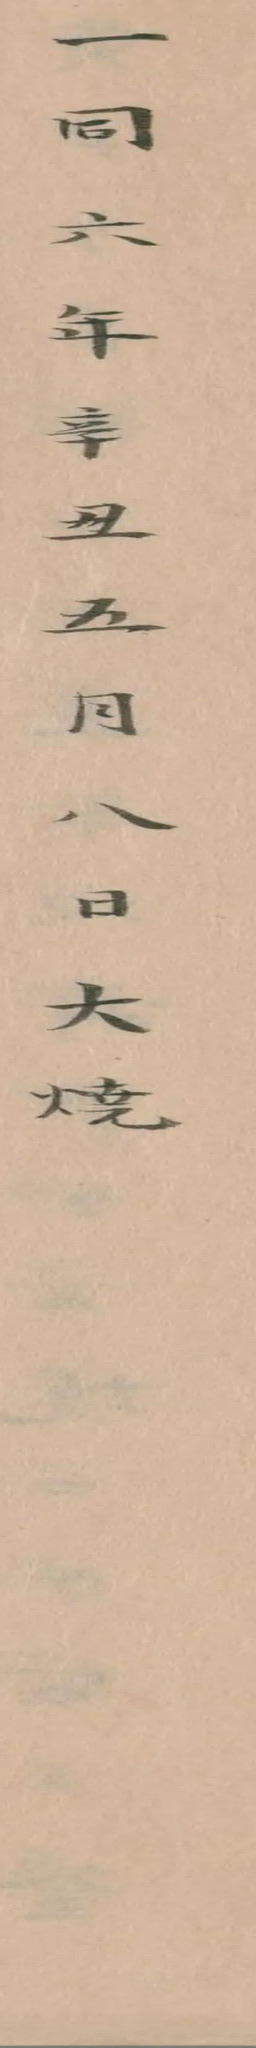一同六年辛丑五月八日大焼
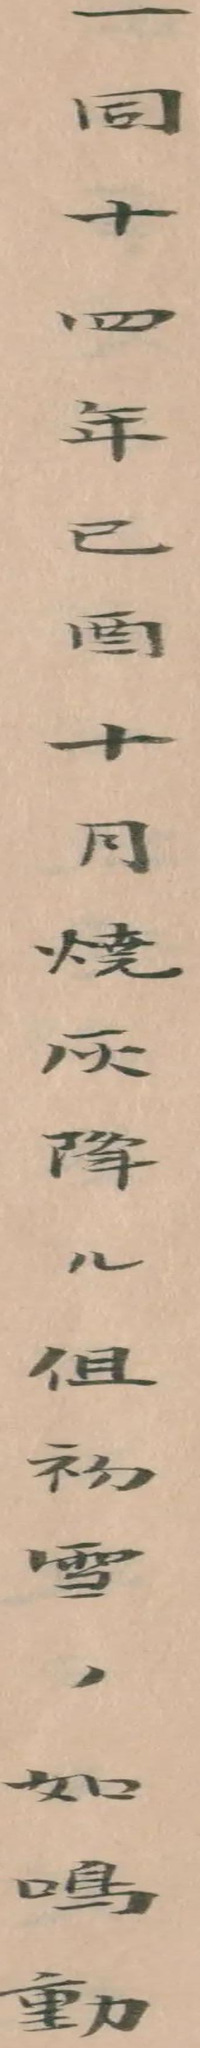一同十四年己酉十月焼灰降ル但初雪ノ如鳴動
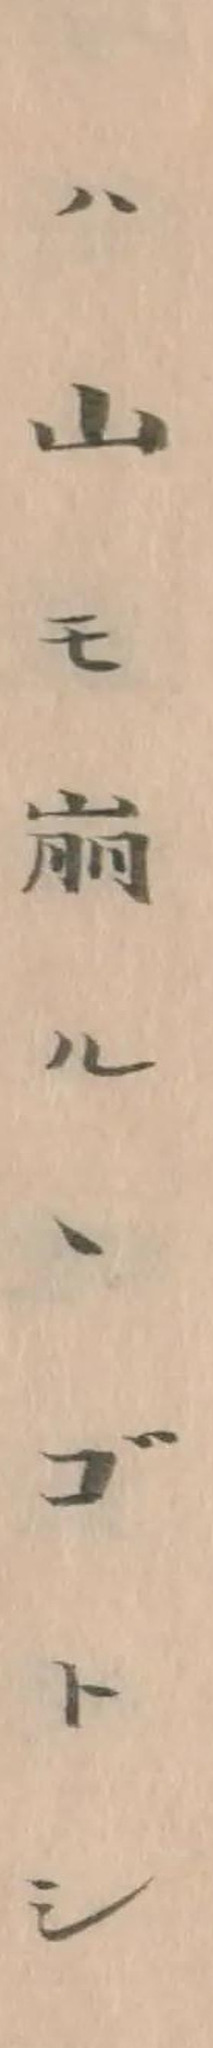ハ山モ崩ルゝゴトシ
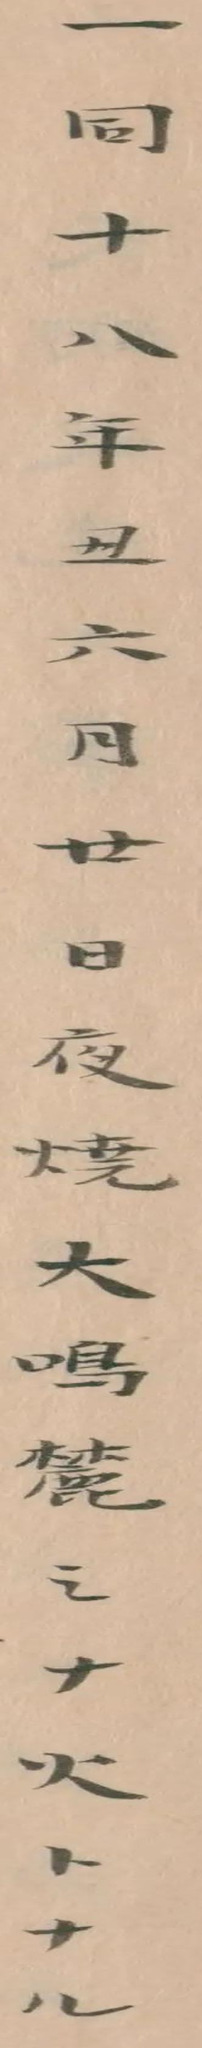一同十八年丑六月廿日夜焼大鳴麓ミナ火トナル

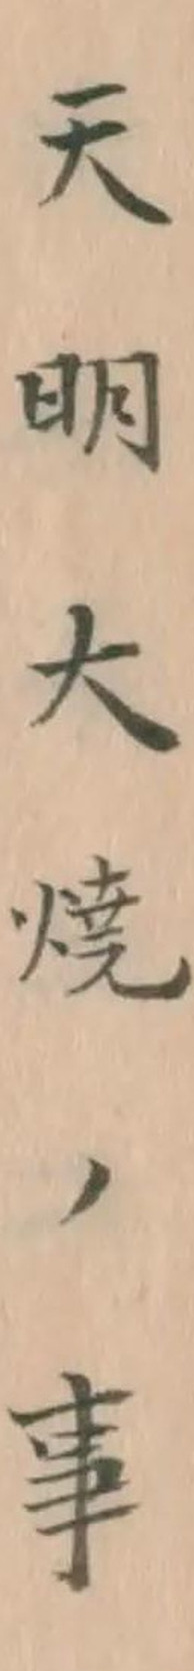天明大焼ノ事
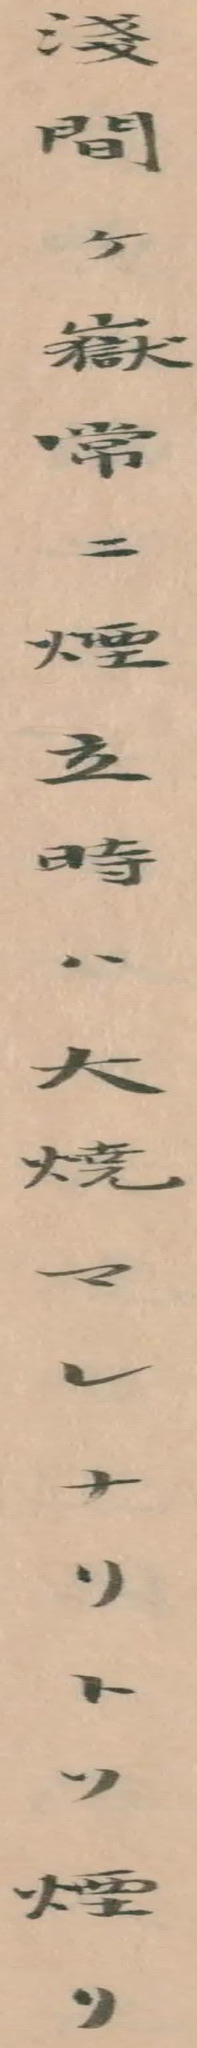浅間ヶ嶽常二煙立時ハ大焼マレナリトソ煙リ
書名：地災撮要. 巻3(地震之部)-巻4(噴火之部)
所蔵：国立国会図書館 National Diet Library, JAPAN
